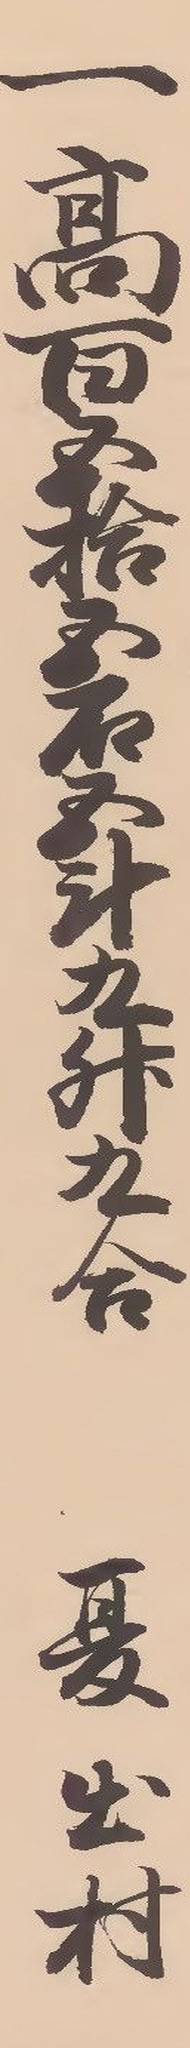一高百五拾五石五斗九升九合夏出村
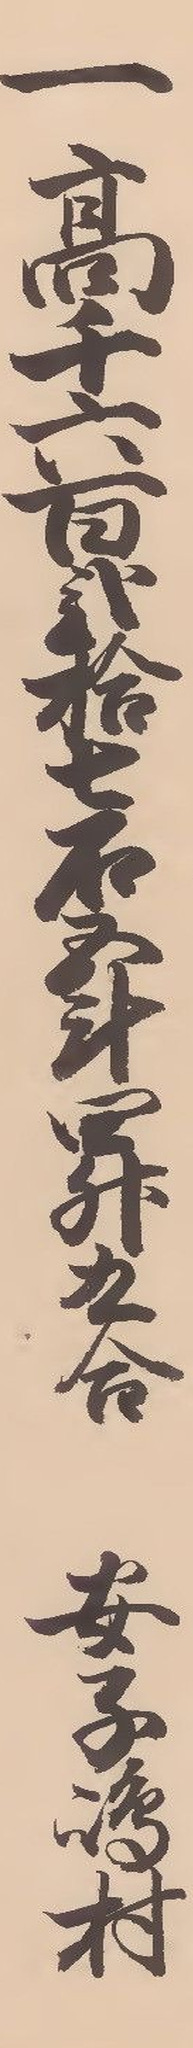一高千六百弐拾七石五斗四升九合安子島村
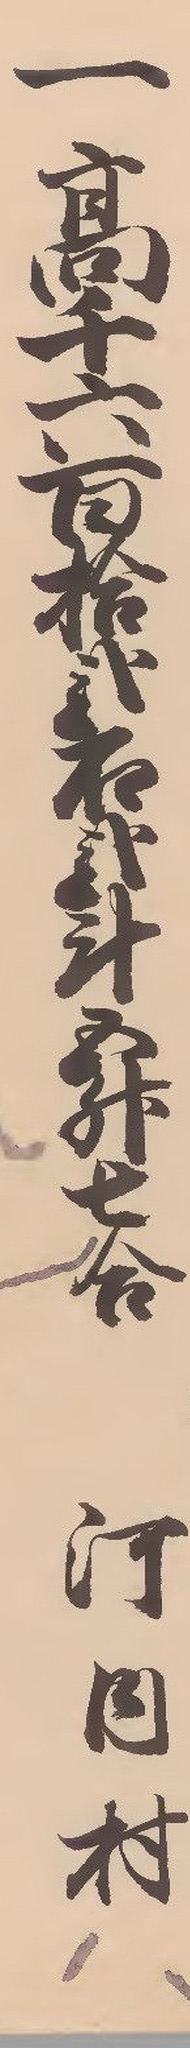一高千六百拾弐石弐斗五升七合河内村

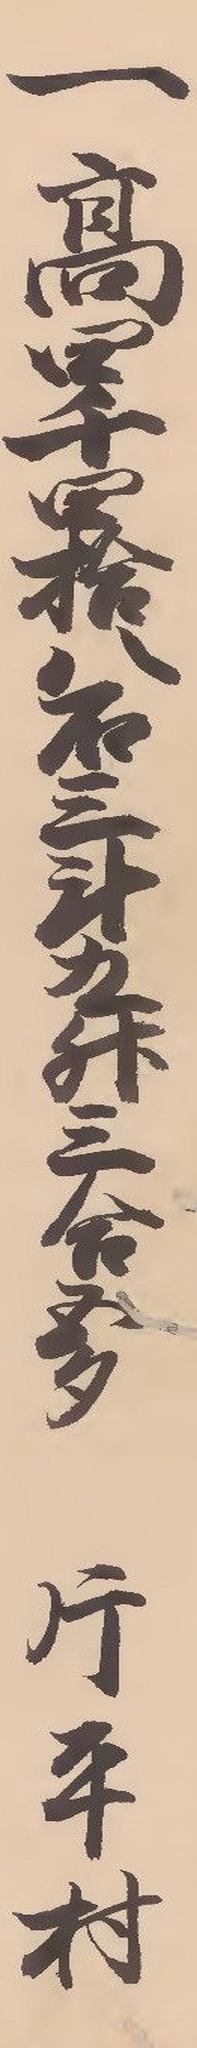一高四千四拾八石三斗九升三合五勺片平村
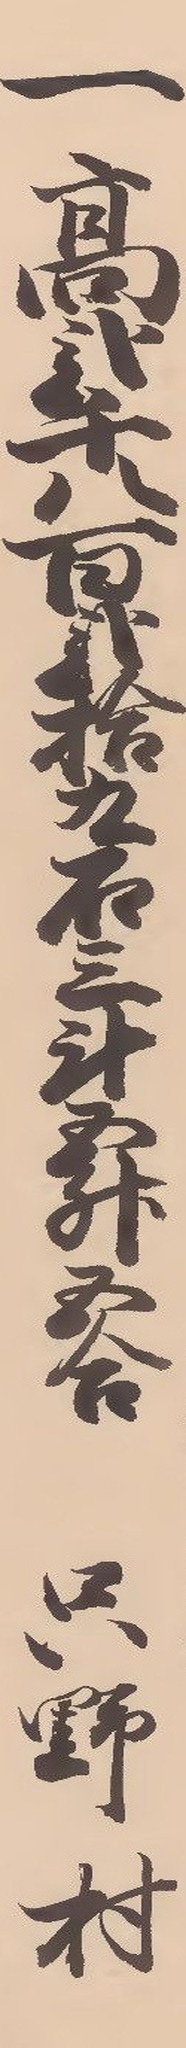一高弐千八百弐拾九石三斗五升五合只野村
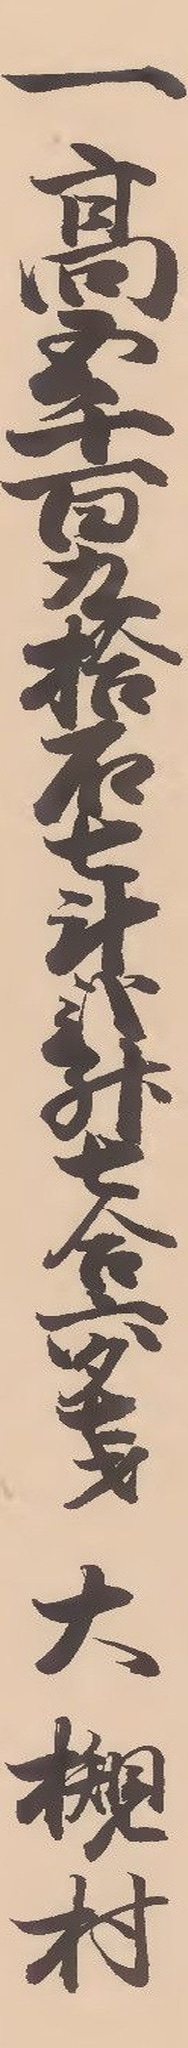一高五千百九拾石七斗弐升七合六勺七才大槻村
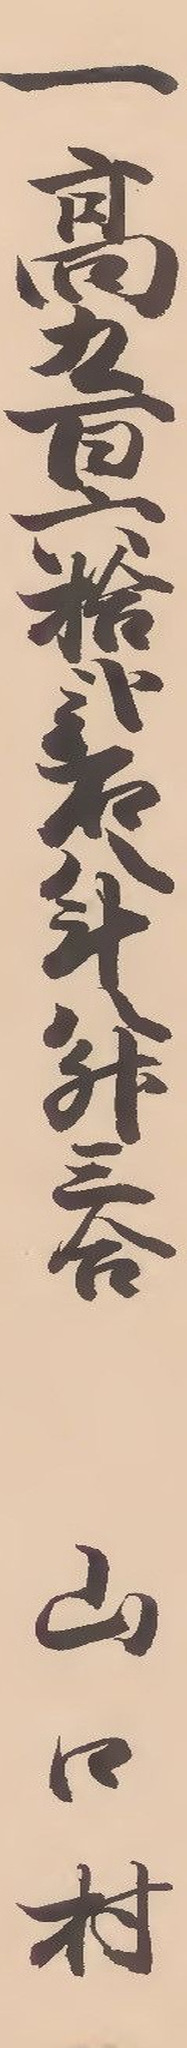一高九百六拾弐石八斗八升三合山口村
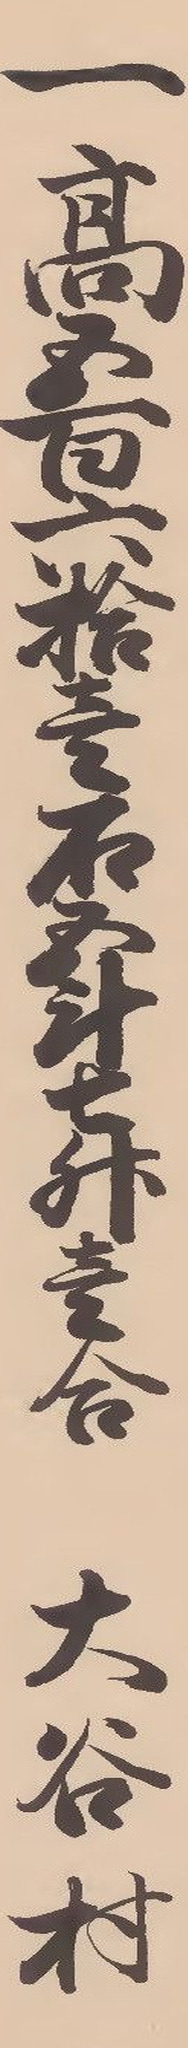一高五百六拾壱石五斗七升壱合大谷村
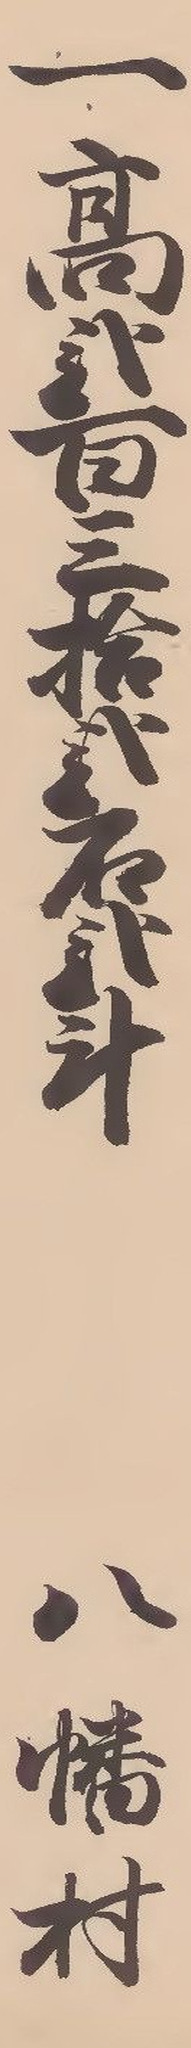一高弐百三拾弐石弐斗八幡村
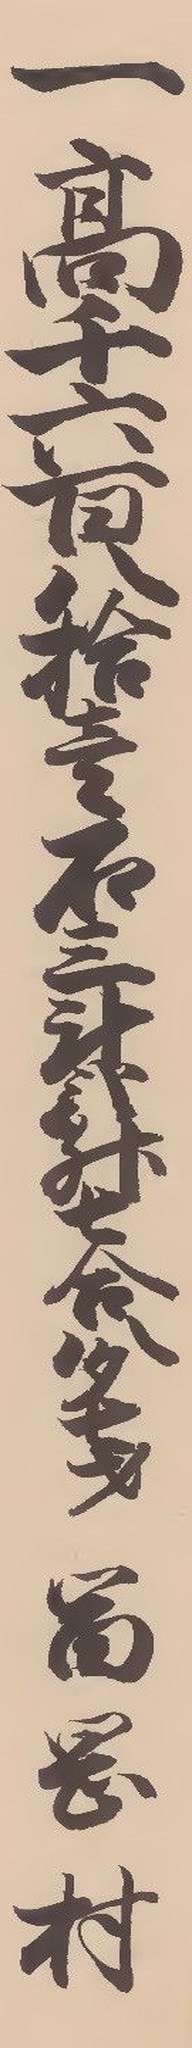一高千六百八拾壱石三斗弐升七合八勺七才富岡村
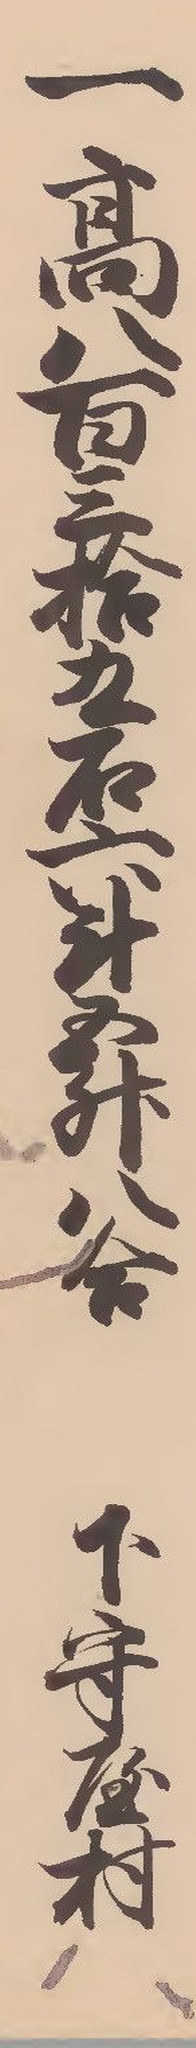一高八百三拾九石六斗五升八合下守屋村

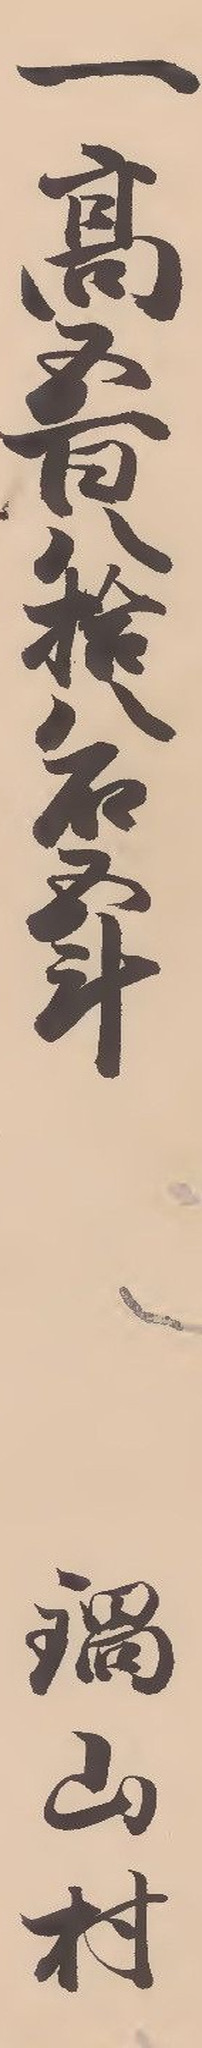一高五百八拾八石五斗鍋山村
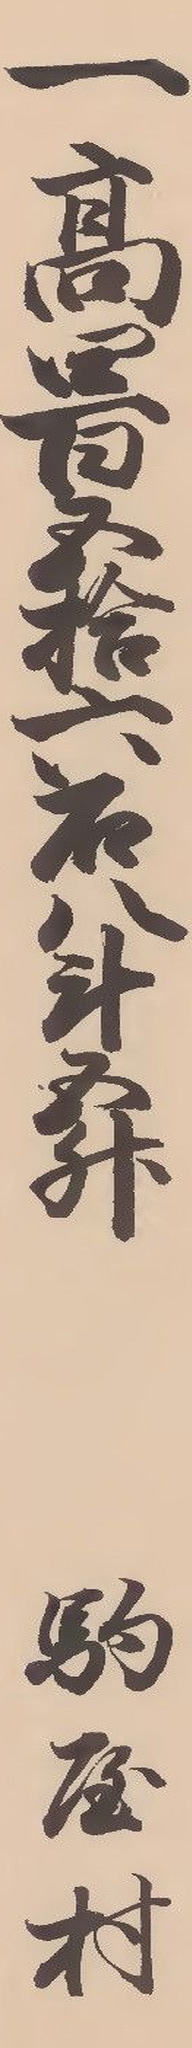一高四百五拾六石八斗五升駒屋村
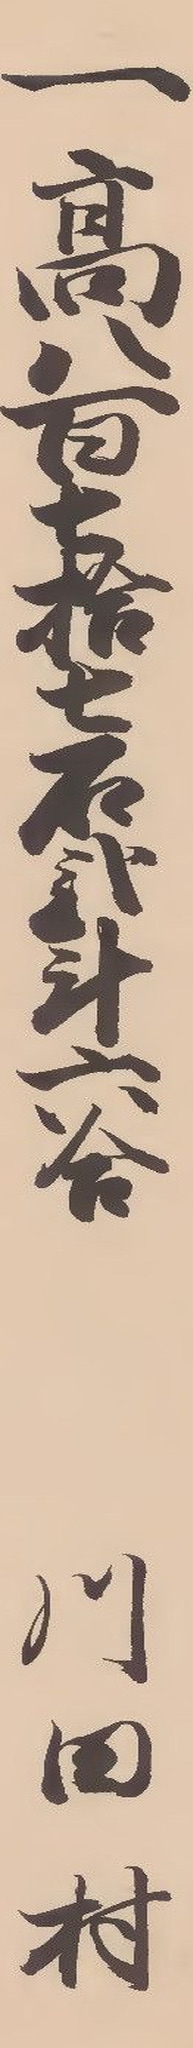一高八百七拾七石弐斗六合川田村
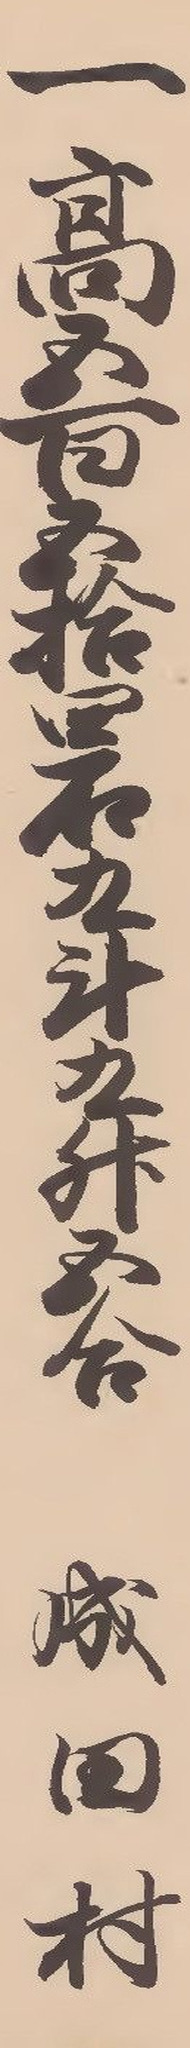一高五百五拾四石九斗九升五合成田村
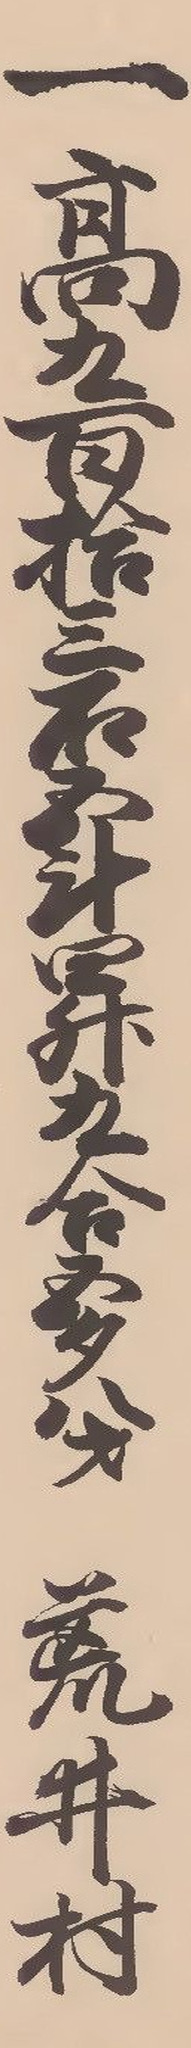一高九百拾三石五斗四升九合五勺八才荒井村
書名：陸奥国郷帳　２
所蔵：国立公文書館 National Archives of Japan
